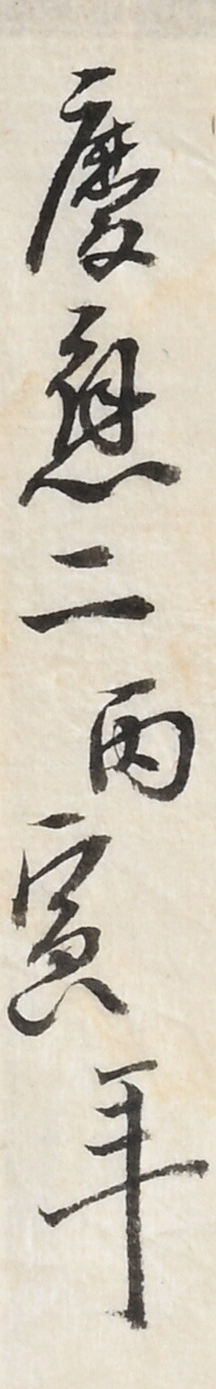慶応二丙寅年
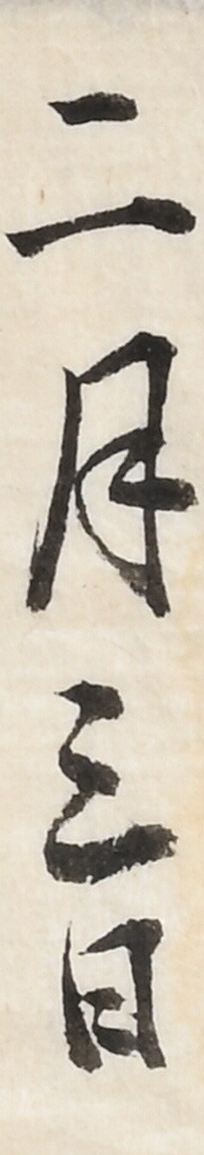二月三日
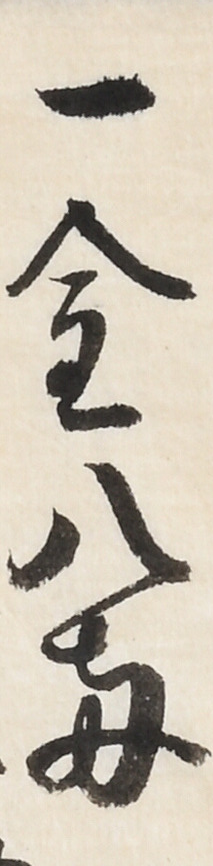一金八両
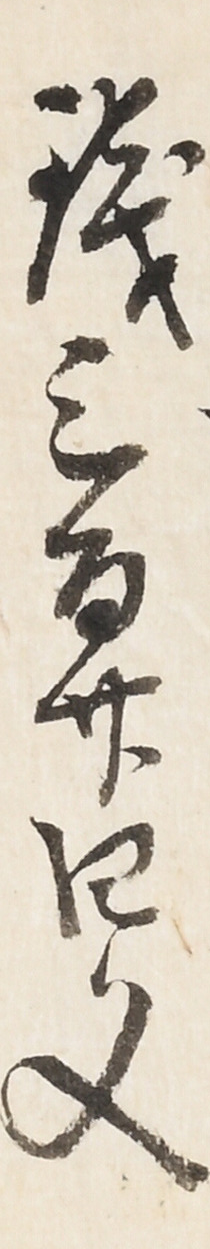残三百廿四文
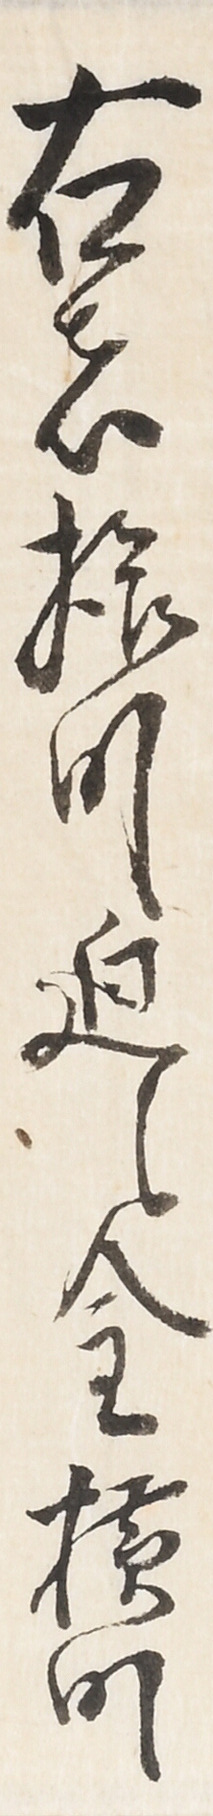右は拾町廻し金横町
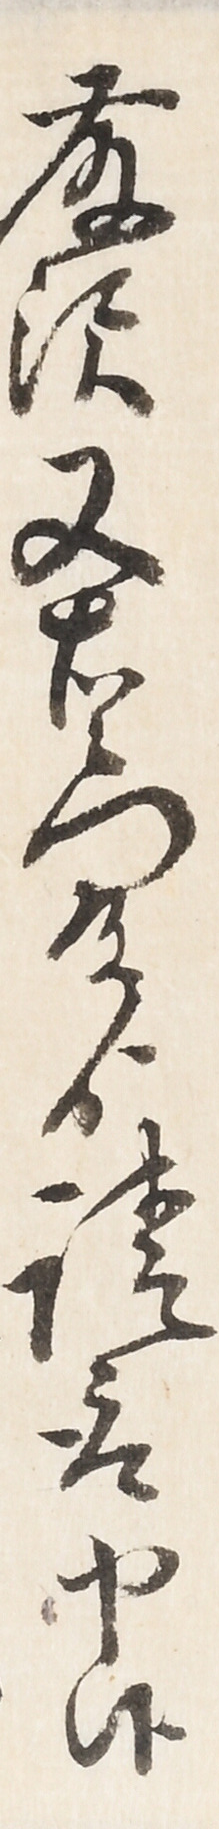藤沢又右衛門殿より請取申候
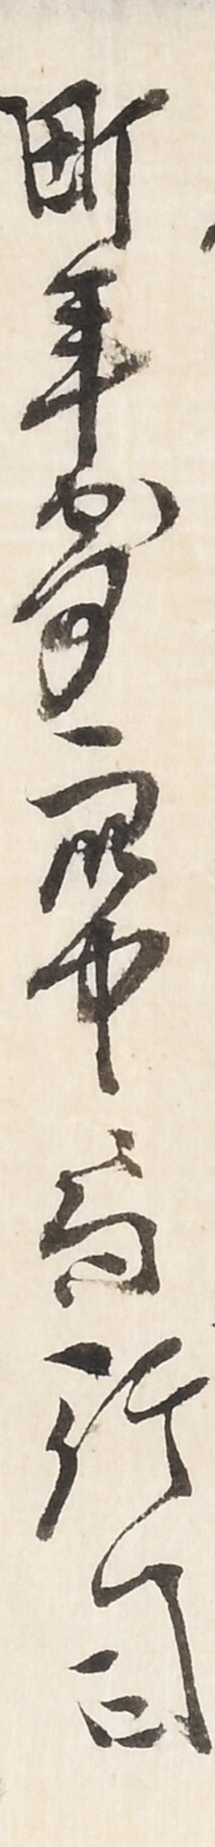町年寄衆中ニ而行司
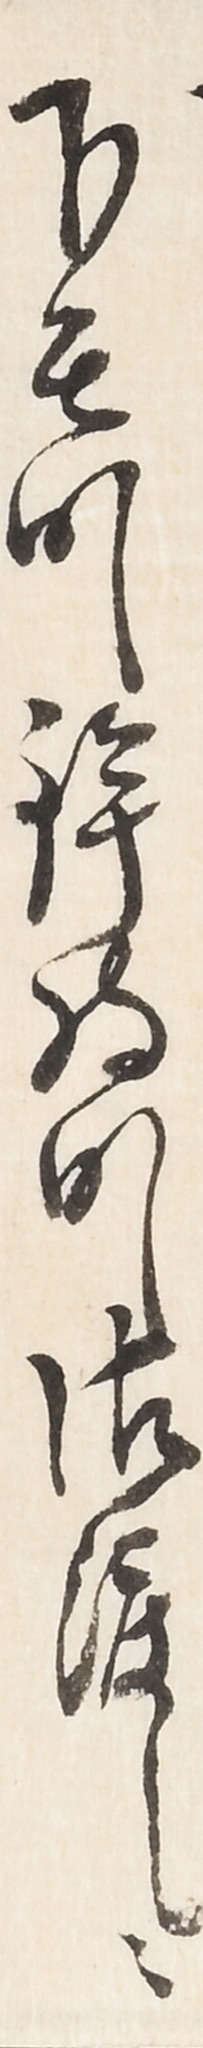下モ町鉾持町御渡し候ニ
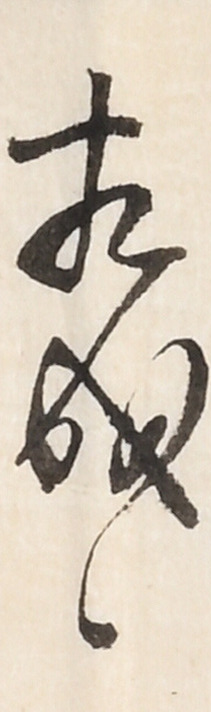相成候
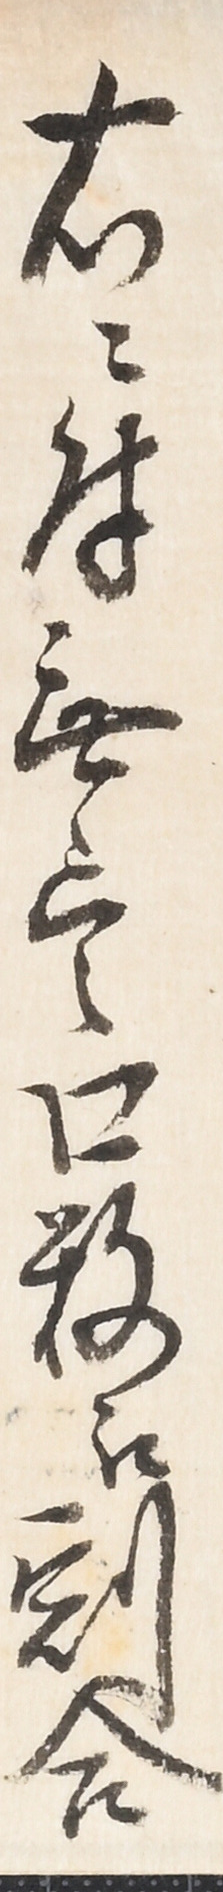右ニ付無尽口数江割合
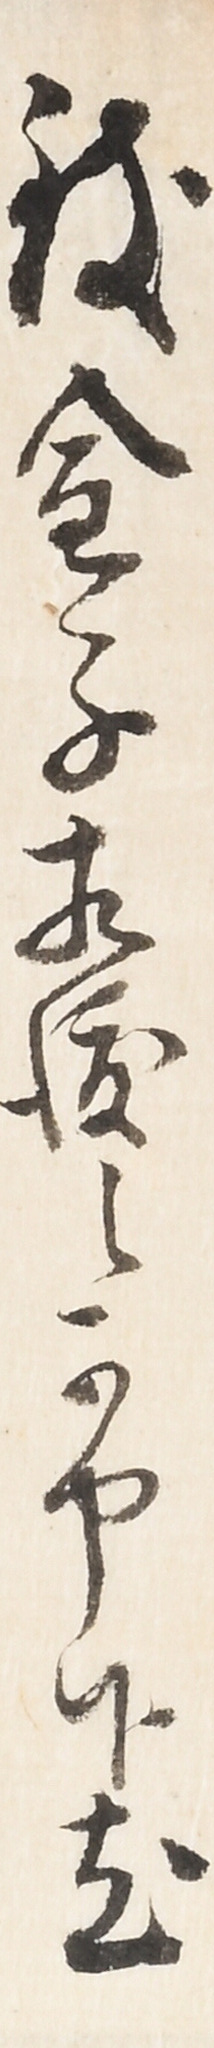致金子相渡し可申候尤
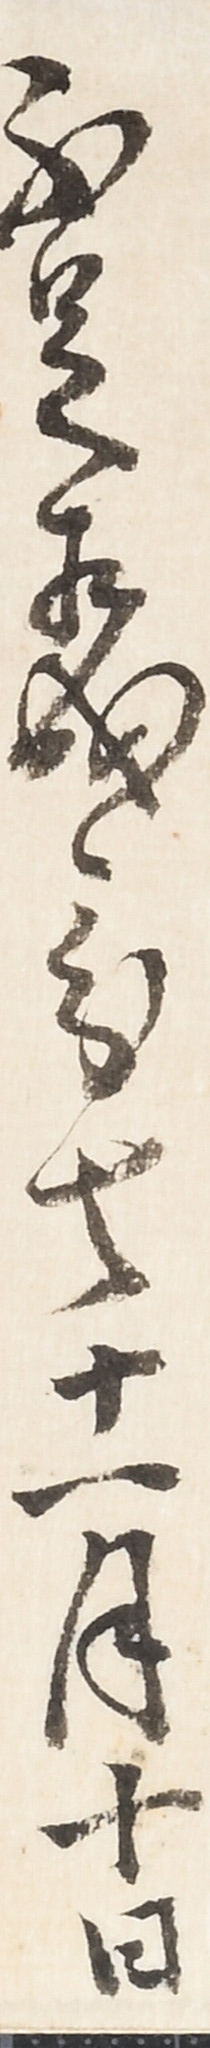不足相成候分は十一月十日
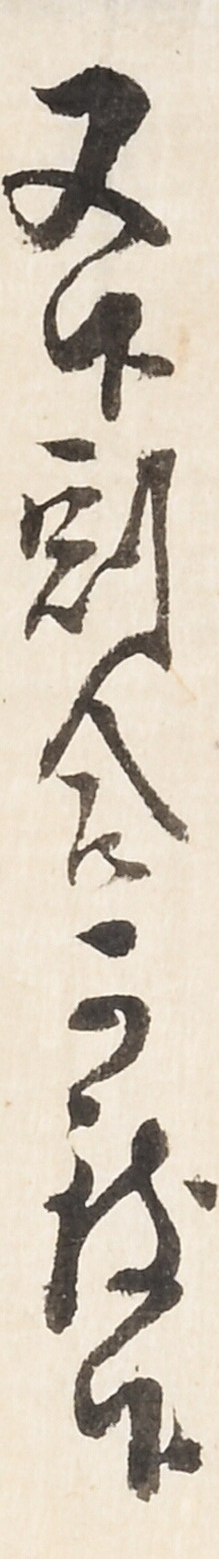又候割合可致候
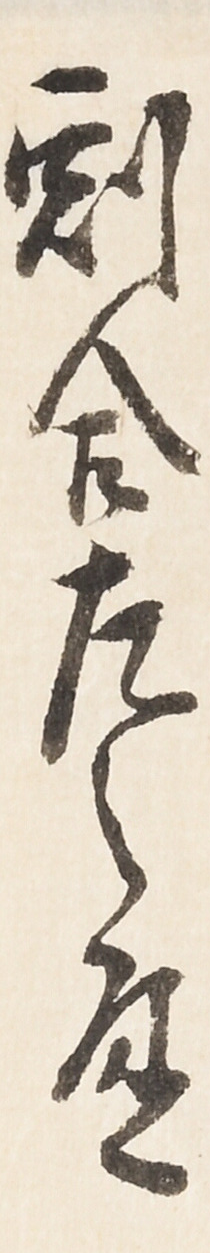割合左之通

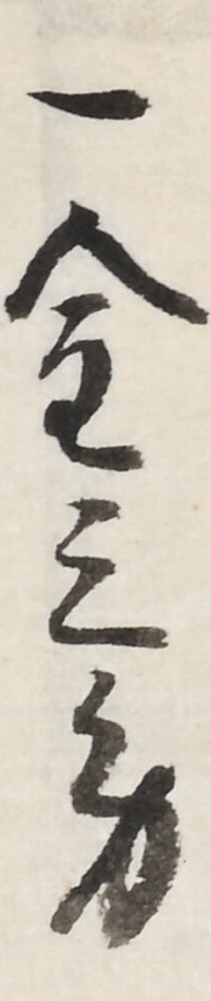一金弐分
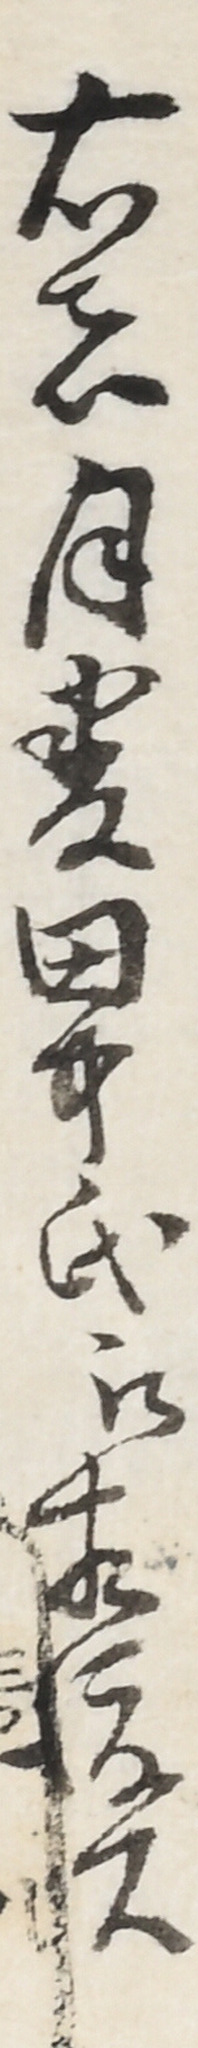右は月番田中氏江相渡候
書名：信友講勘定簿
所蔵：伊那市立高遠町図書館・合同会社AMANE
